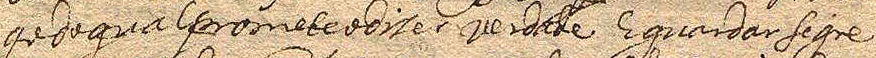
go do qual prometeo dizer verdade E guardar segre
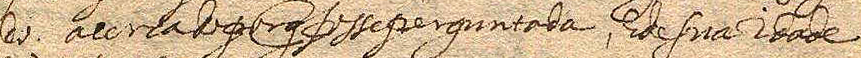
do. açerca do porq̄ fosse perguntada, E de sua Idade
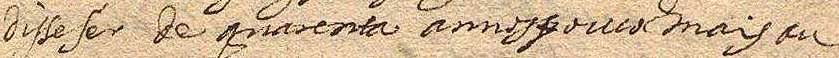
disse ser de quarenta annos pouco mais ou
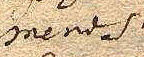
menos.
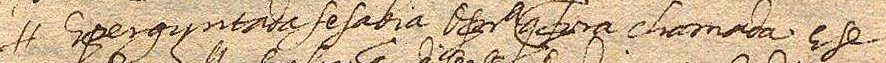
item E perguntada se sabia o pra q̄ fora chamada E se
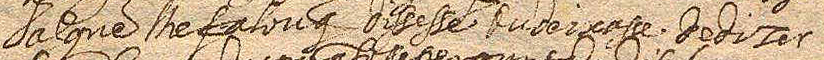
alguē lhe falou q̄ dissesse ou deixasse de dizer
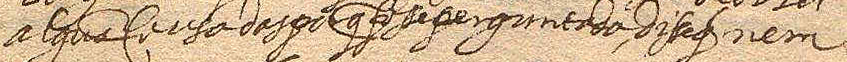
alguā Cousa das por q̄ fosse perguntada, disse q̄ nem
